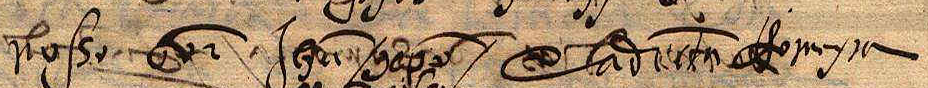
nosso sōr Jhū / xpō / e a dīcta Romeyra
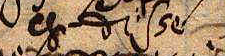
lhe disse
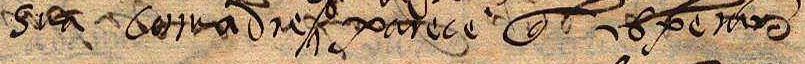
sua comadre / parece q̄ esperam̄
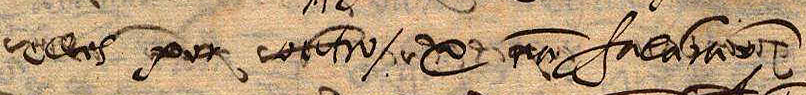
elles por outro /. e nā falaraõ
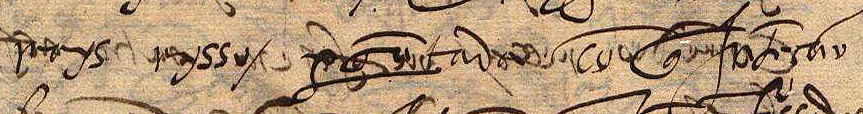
mays nysso / ꝑgūtada cō q̄ Jntēção
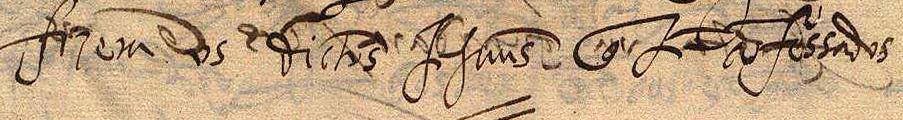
fizera os dictos JeJuūs q̄ tē cōfessados
